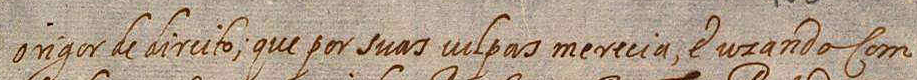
o rigor de direito; que por suas culpas merecia, e uzando Com
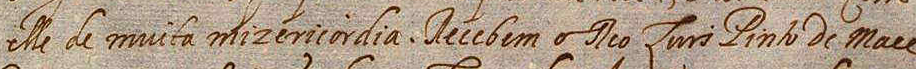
elle de muita mizericordia. Recebem o Reo Luis Pinto de mace
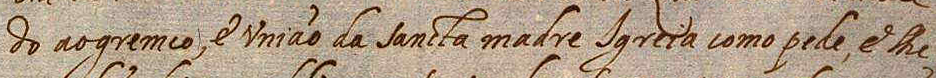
do ao gremio, e vnião da sancta madre Igreia como pede, e lhe
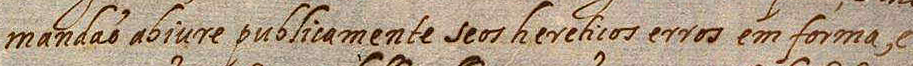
mandaõ abiure publicamente seos hereticos erros em forma, e
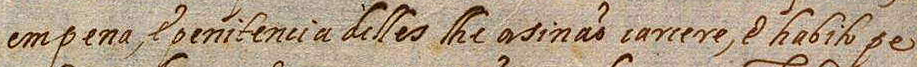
em pena, e penitencia delles lhe asinaõ carcere, e habito pe
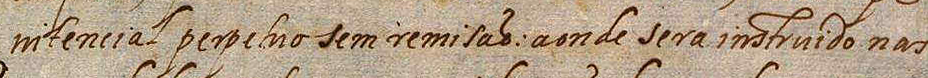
nitencial perpetuo sem remisaõ: aonde sera instruido nas
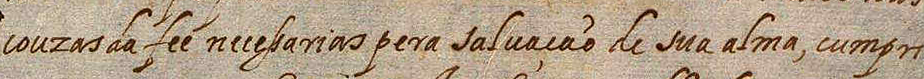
couzas da feé necessarias pera saluação de sua alma, cumpri
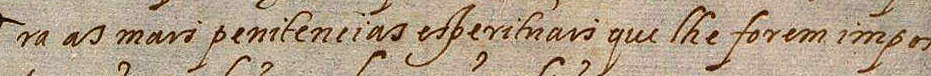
ra as mais penitencias esperituais que lhe forem impos
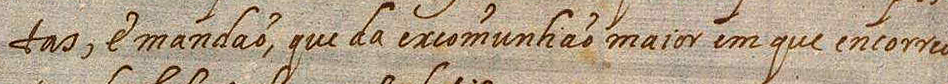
tas, e mandaõ, que da excom̄unhão maior em que encorreo
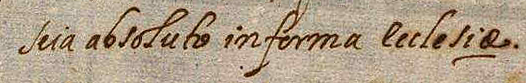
seia absoluto in forma ecclesiæ.
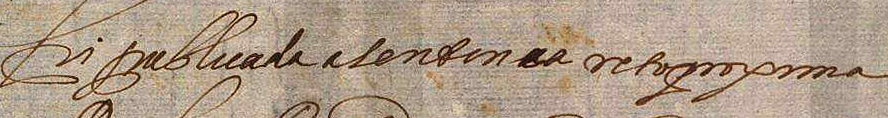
foi publicada a sentença reto proxima
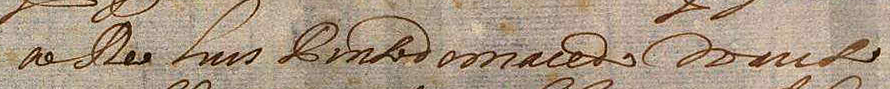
ao Reo Luis Pinto do macedo no auto
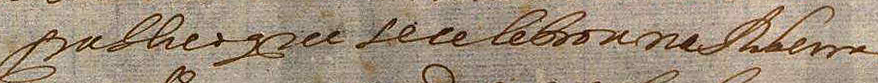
publico que se celebrou na Ribeira
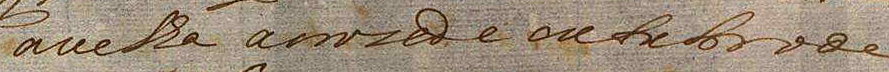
a uelha a onze de outubro de
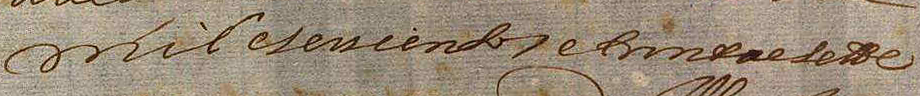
mil e seiscentos e trinta e sette
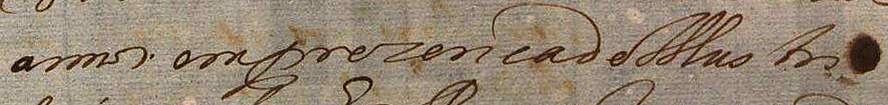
annos em prezença do Illustris
